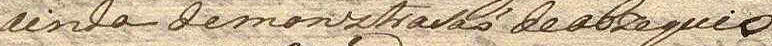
ainda demonztrasaõ de obzequio
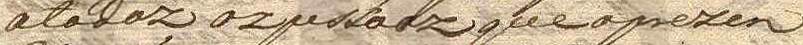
a todaz az pessoaz que o prezen
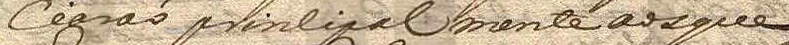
Ciaraõ principalmente aos que
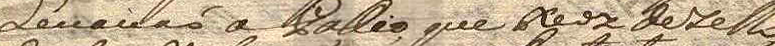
Leuauaõ o Pallio, que xeoz de zello
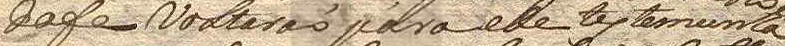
da fe Voltaraõ para elle testemunha
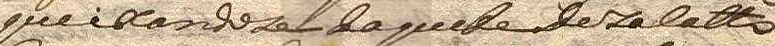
queixandoze daquelle dezacatto
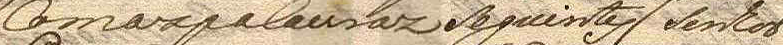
Com az palauraz seguintes (senhor
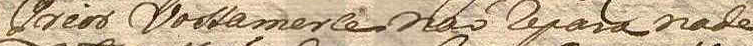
Prior Vossamerce naõ Repara na de
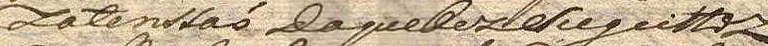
Zatenssaõ daquellez sugeittoz)
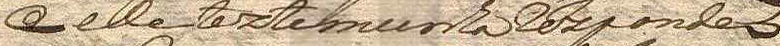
e elle teztemunha Rezpondeo
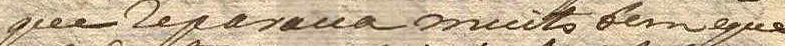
que Reparaua muito bem e que
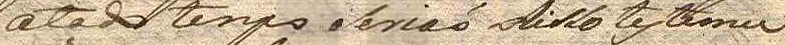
a todo tenpo seriaõ disso testemu
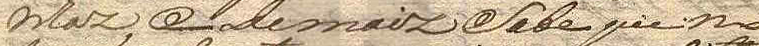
nhaz, e ademaiz Sabe que no
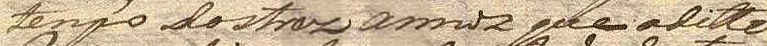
tenpo dos trez annoz que o ditto
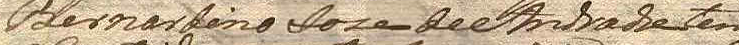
Bernardino Joze de Andrade tem
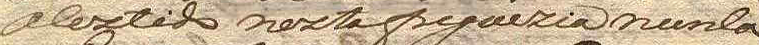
aceztido nezta freguezia nunca
